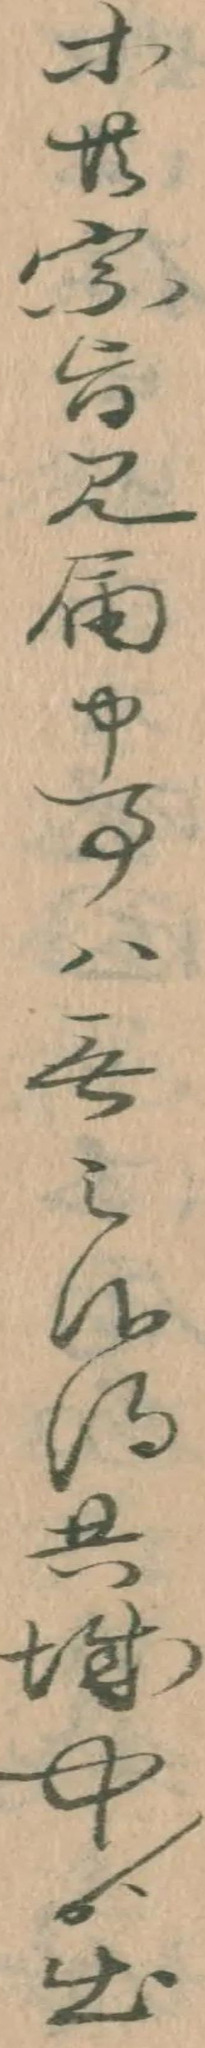等共宗旨見届申事は無之候得共城中ゟ出
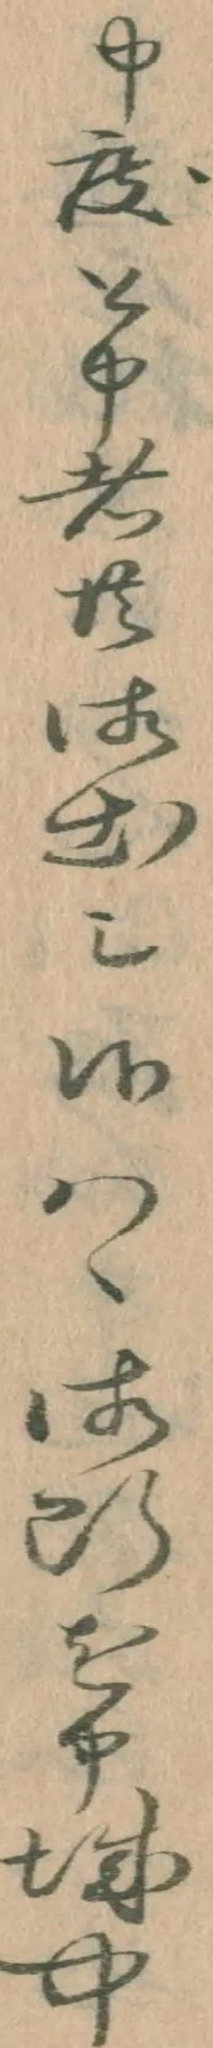申度と申者共御出し候はゝ御断を申城中
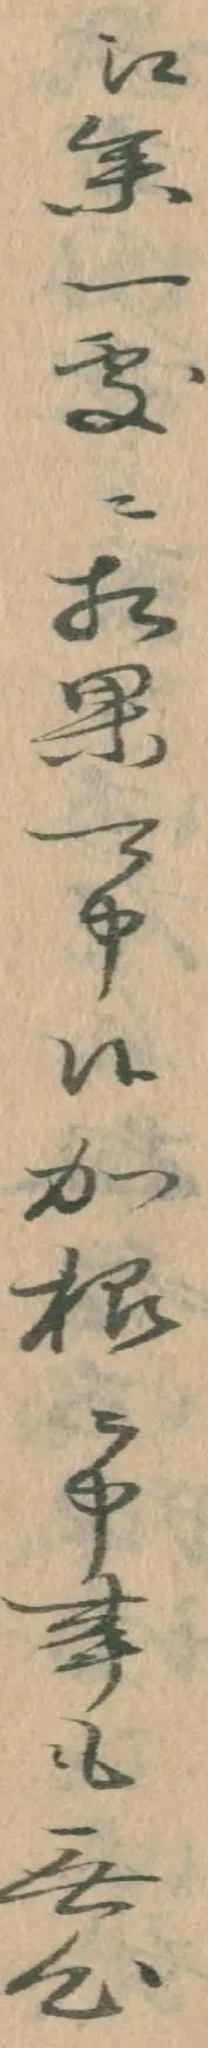江参一處に相果可申候加様に申事も無心
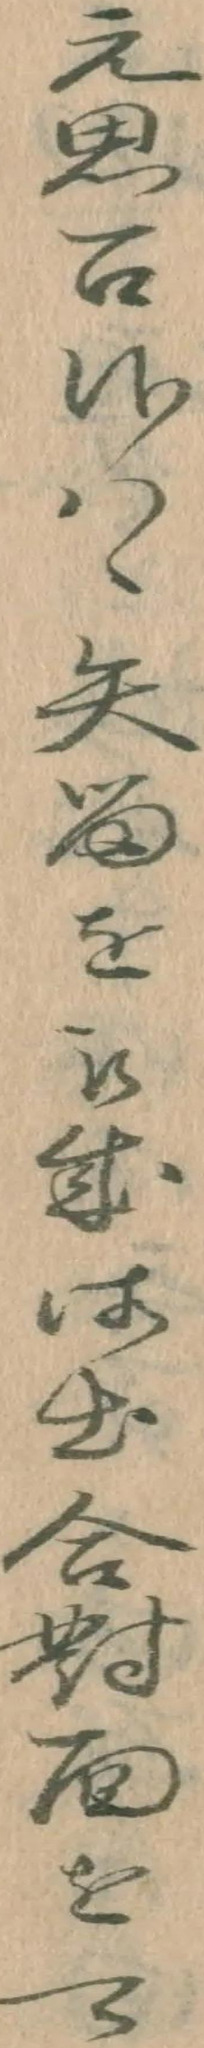之思召候はゝ矢留を被成御出合対面を可
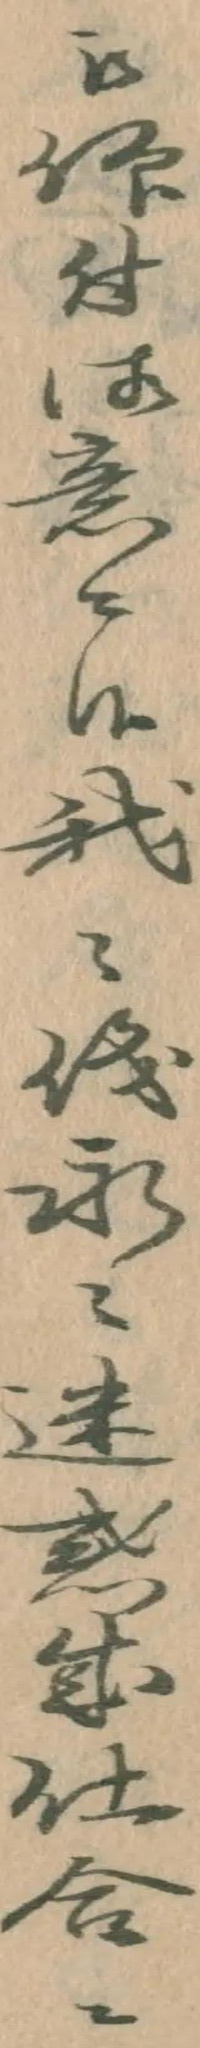被仰付御意に候我々儀永々迷惑成仕合に
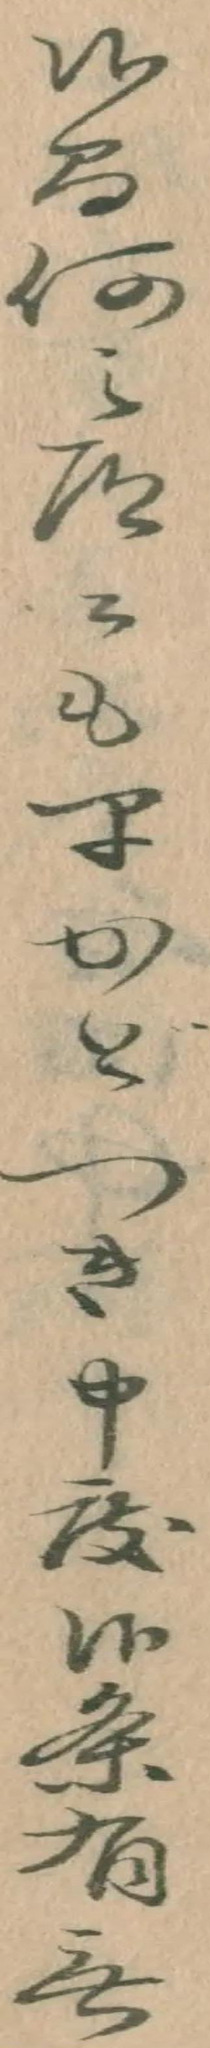候間何之道にも早加とつき申度候条有無
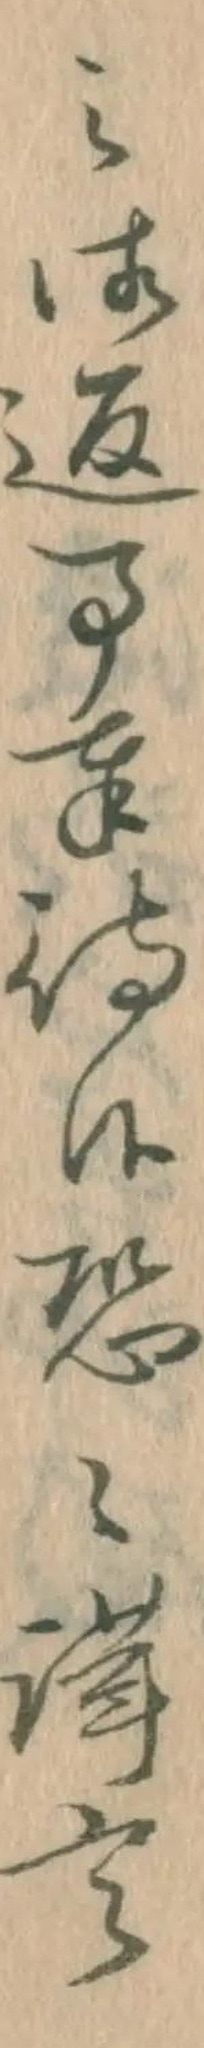之御返事奉待候恐々謹言
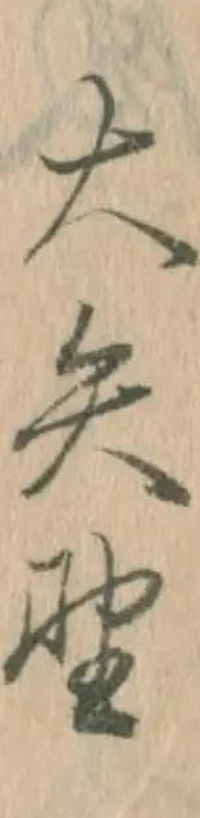大矢野
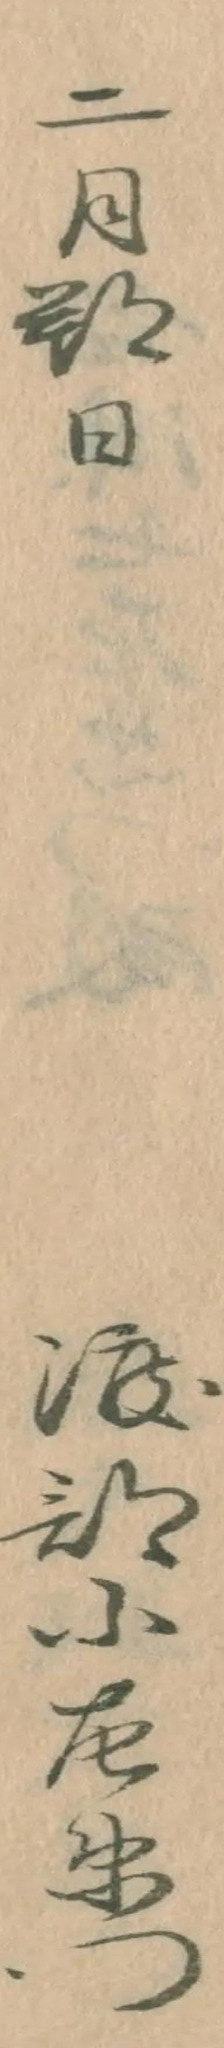二月朔日渡部小左衛門
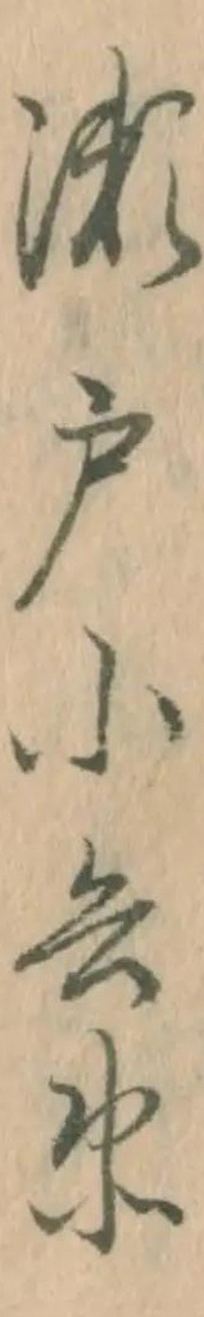瀬戸小兵衛

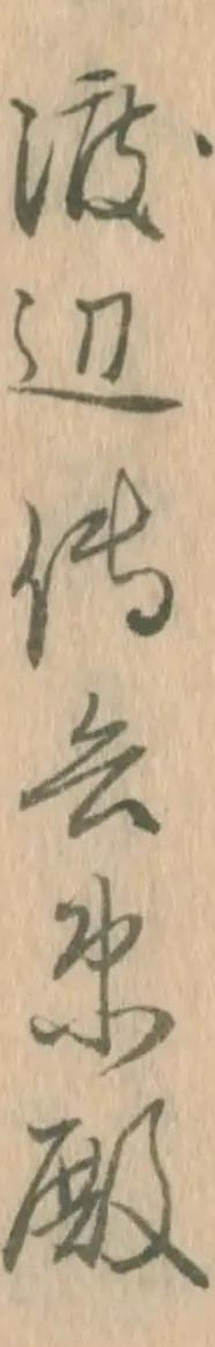渡辺伝兵衛殿
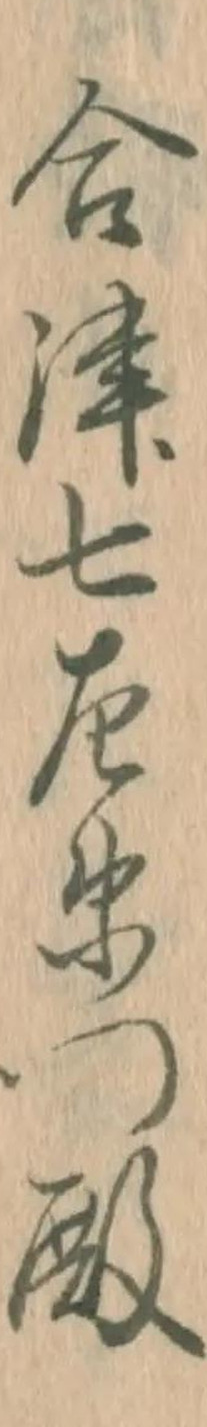合津七左衛門殿
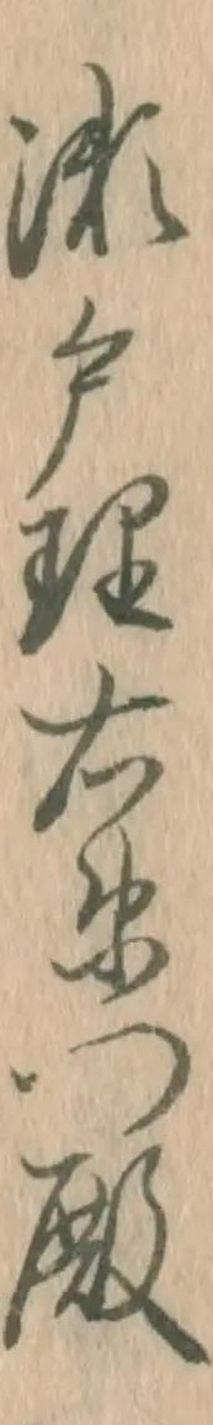瀬戸理右衛門殿
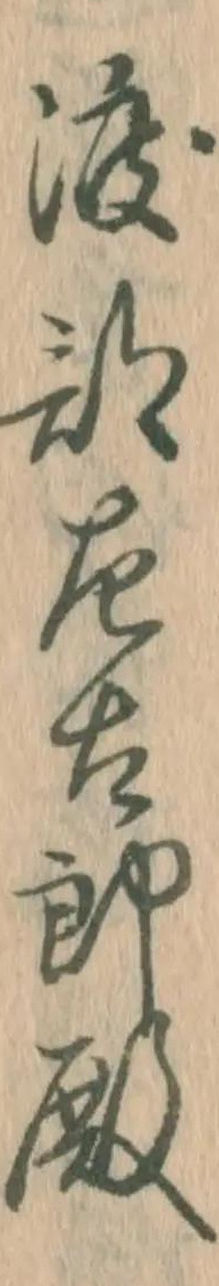渡部左太郎殿
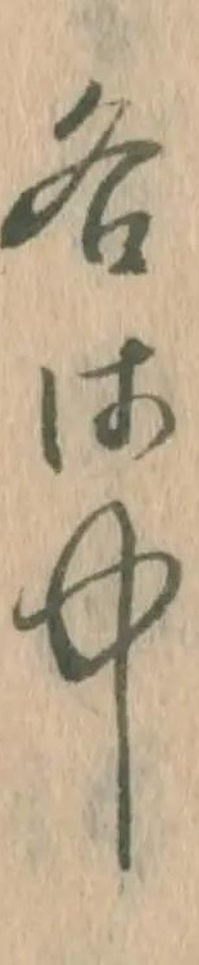各御中
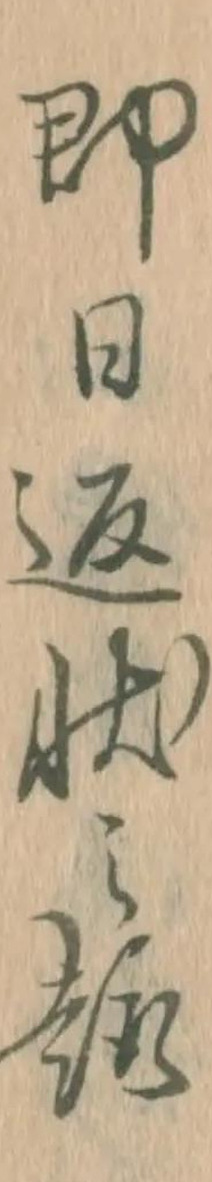即日返状之趣
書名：切支丹御退治記 49巻. [6]
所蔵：国立国会図書館 National Diet Library, JAPAN
